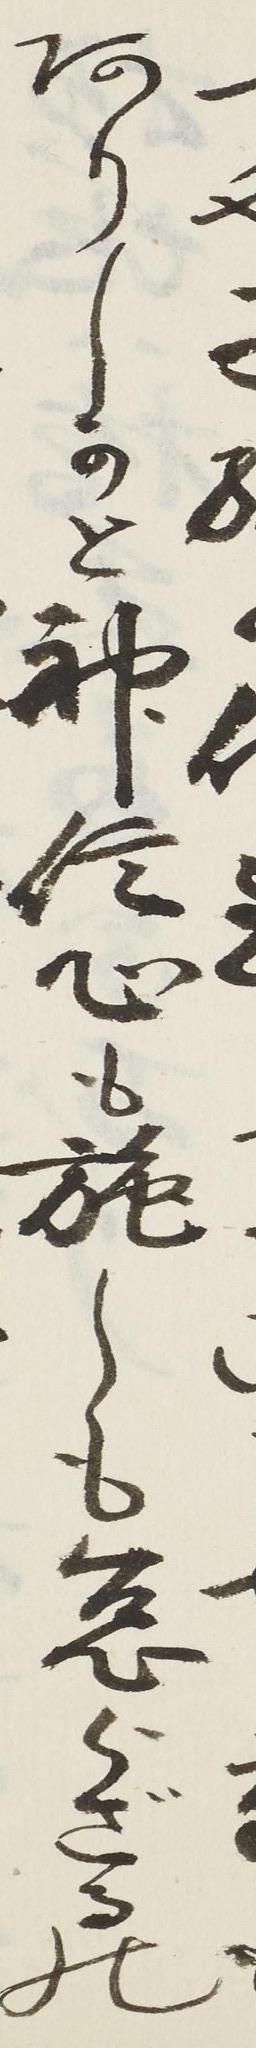ありしかと神信心も施しも怠らざるの
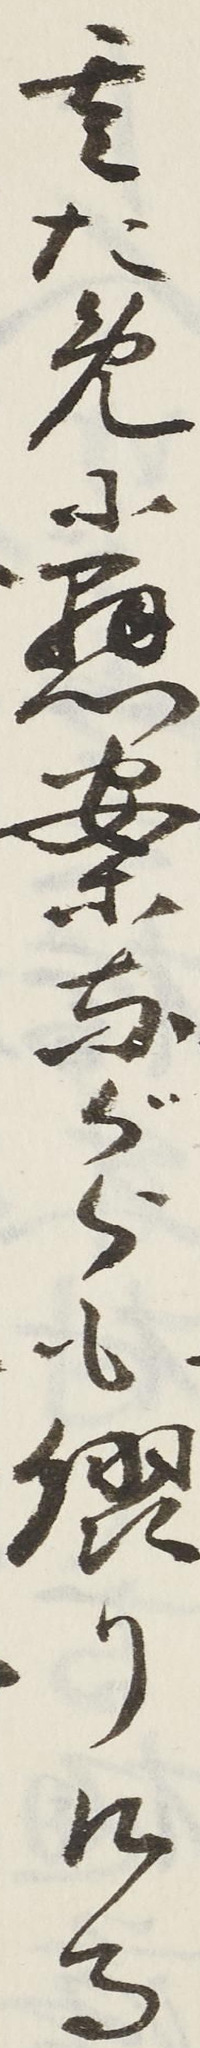其ために想案ながらも躍りける
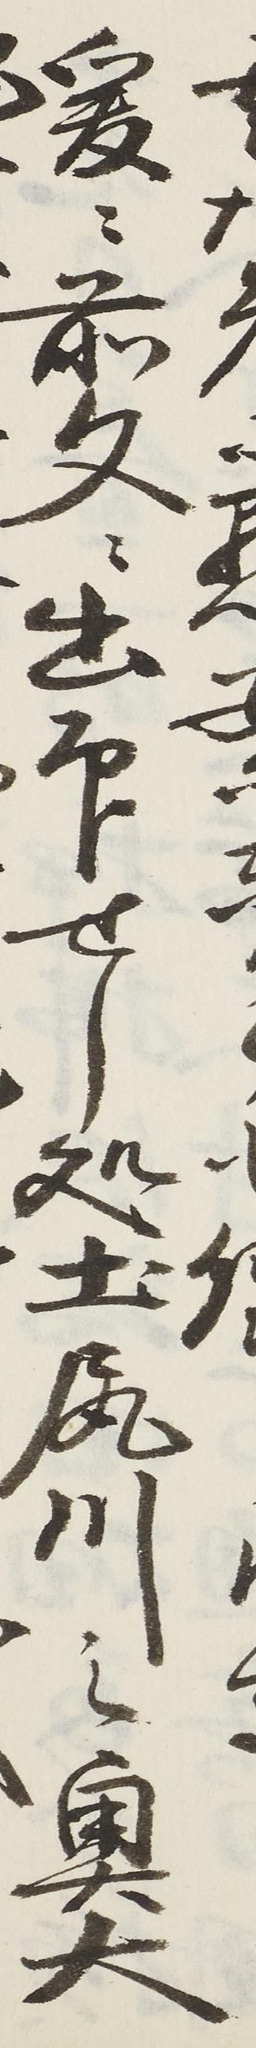爰二前文二書印せし処土尻川之奥大
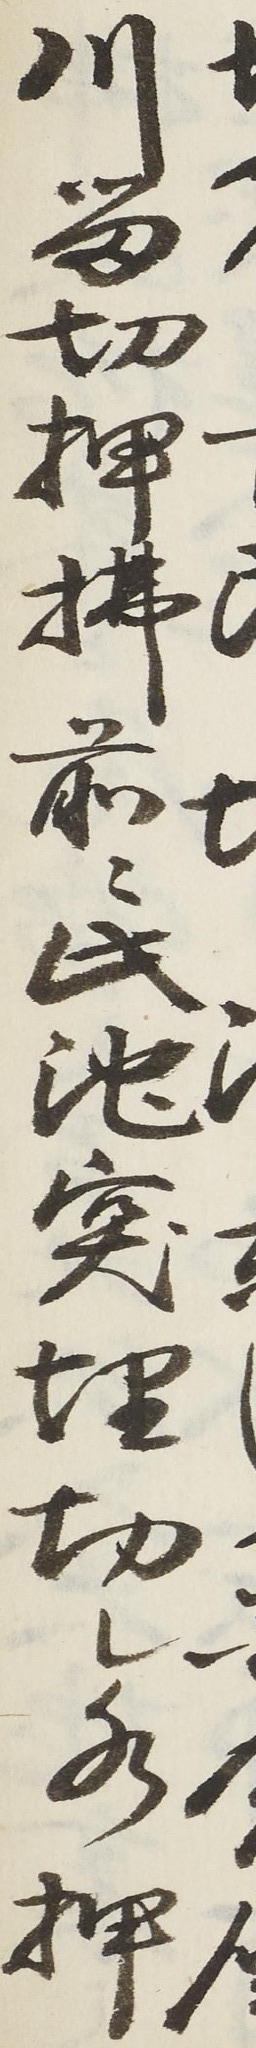川留切押払前々此池突埋切ㇾ水押

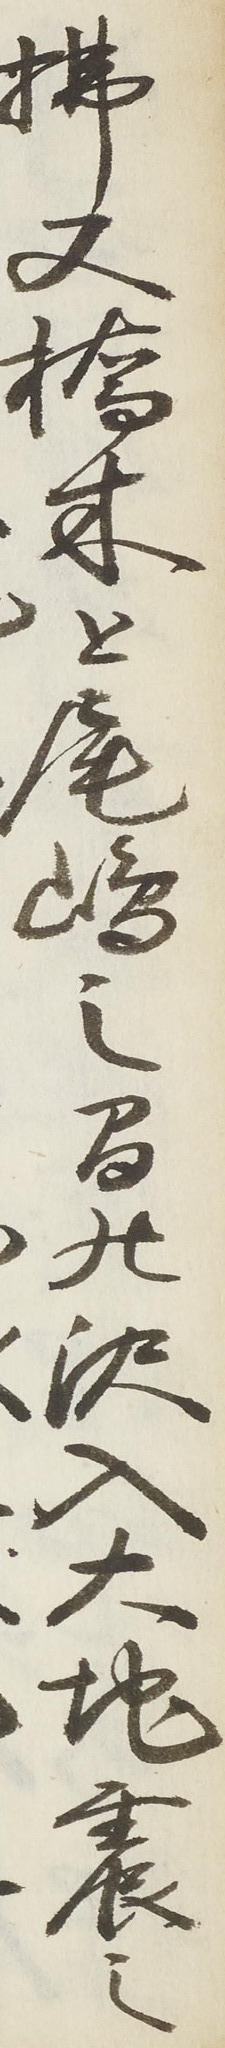払又橋木と尾嶋之間の沢入大地震之
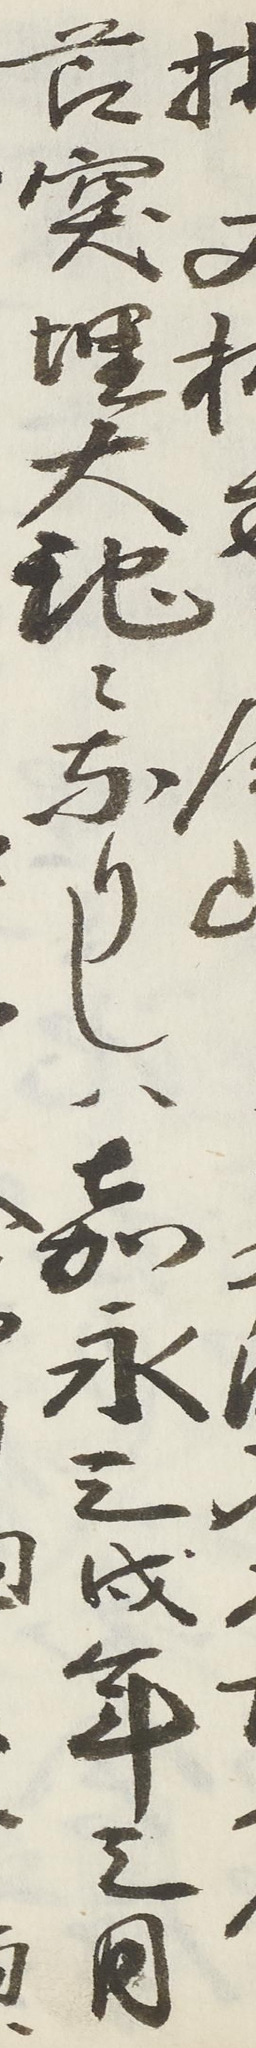節突埋大地二なりしハ嘉永三戌年三月
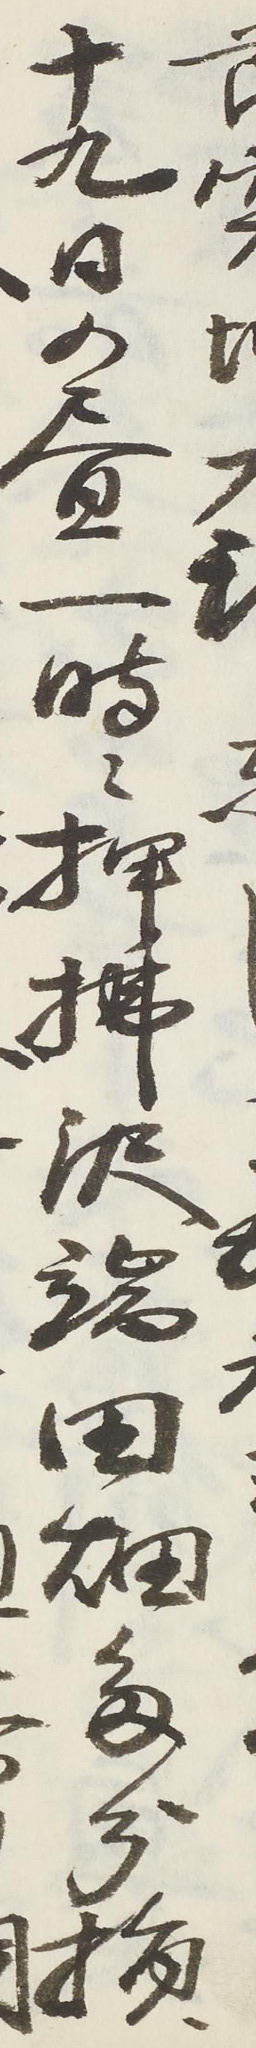十九日の昼一時二押払沢端田畑多分損
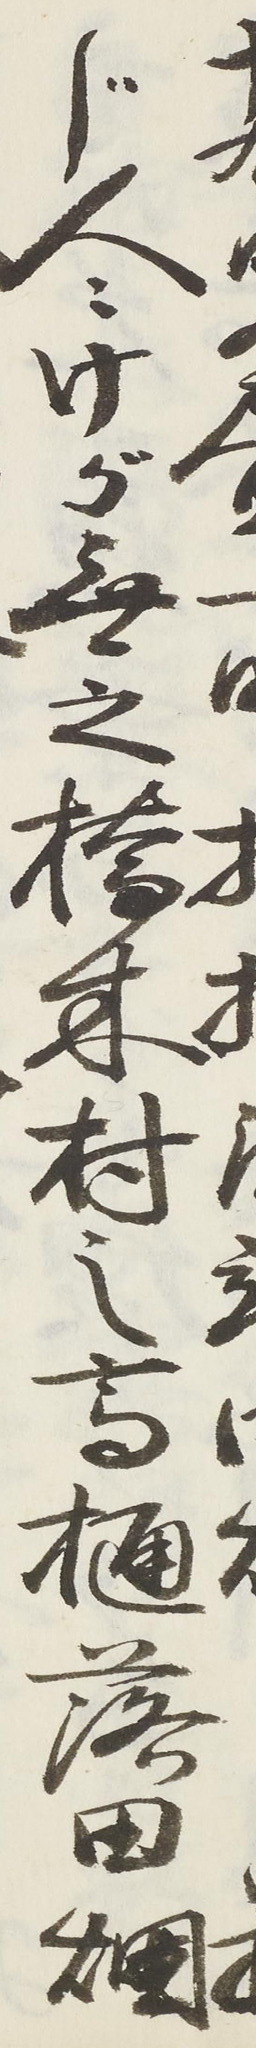じ人二けが無之橋木村之高樋落田畑
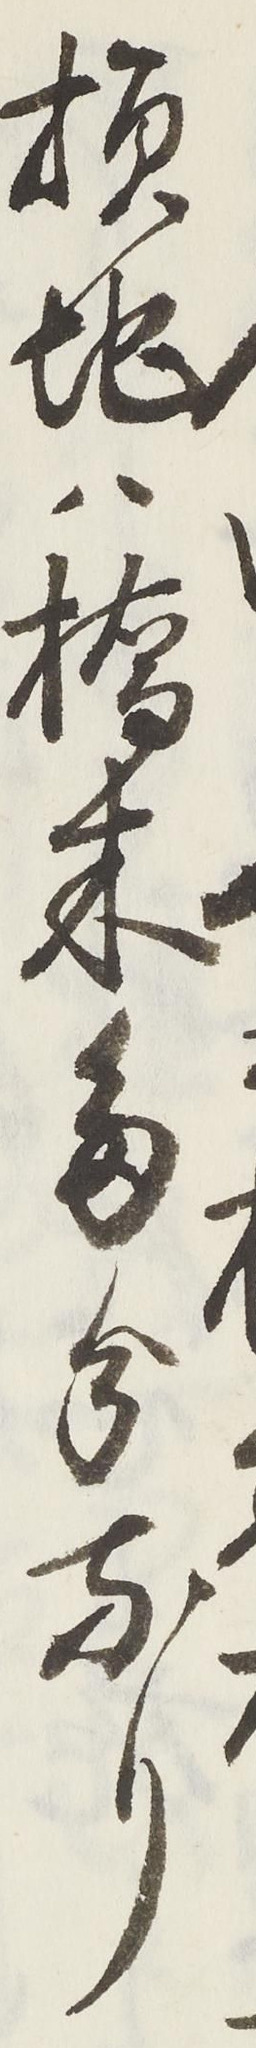損地ハ橋木多分なり
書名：弘化四年地震記
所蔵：東京大学地震研究所図書室 Earthquake Research Institute Library, The University of Tokyo, JAPAN
